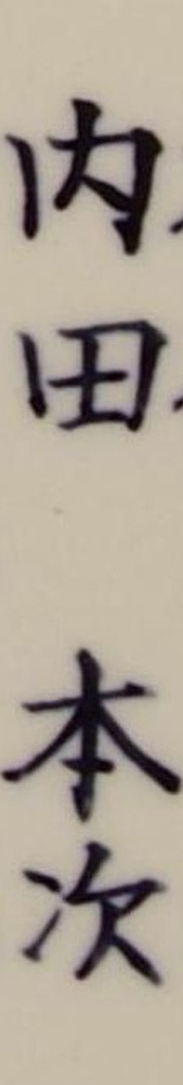内田本次
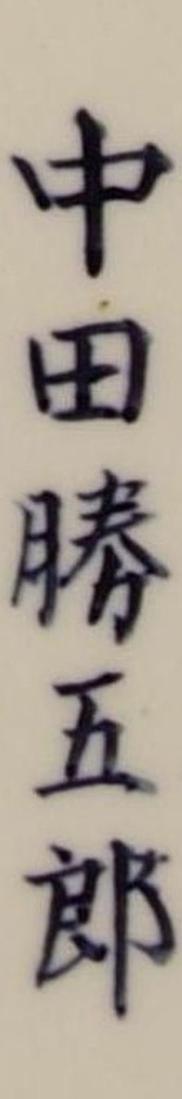中田勝五郎
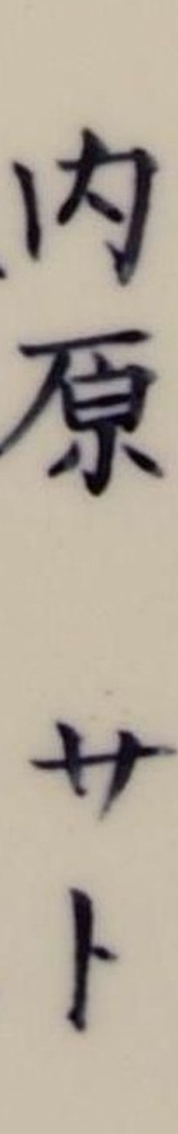内原サト
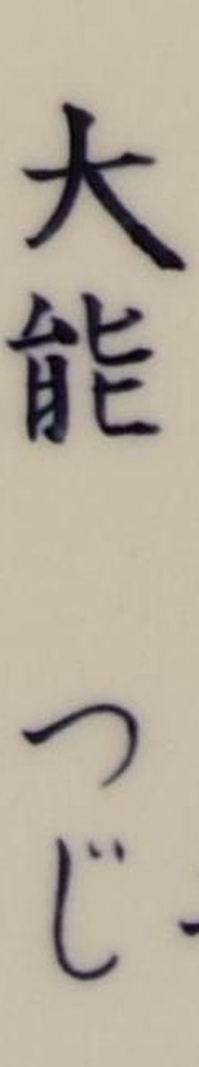大能つじ
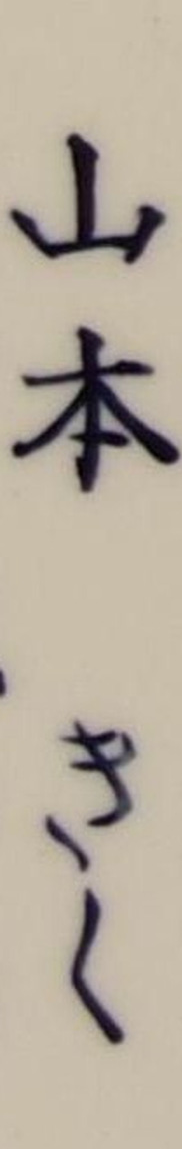山本きく
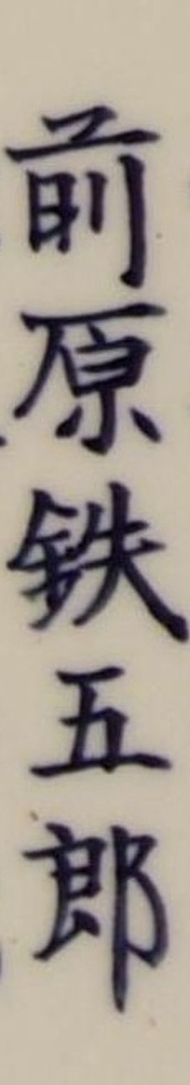前原鉄五郎
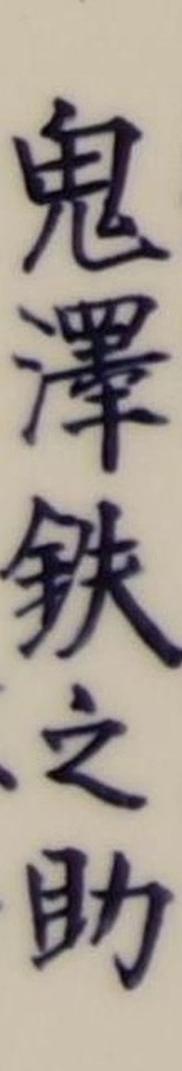鬼澤鉄之助

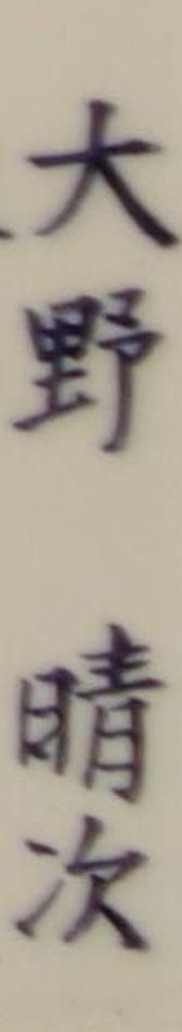大野晴次
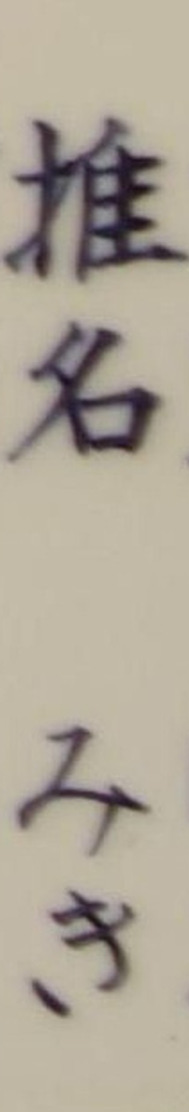椎名みき
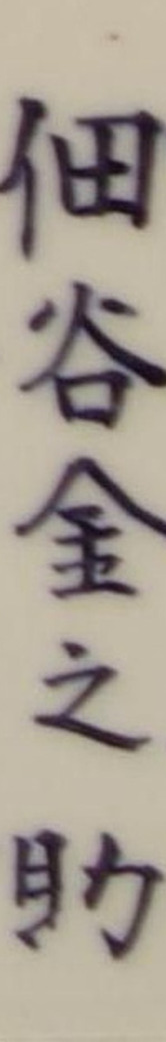佃谷金之助
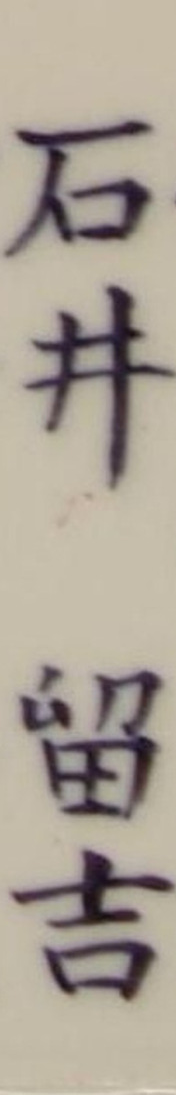石井留吉
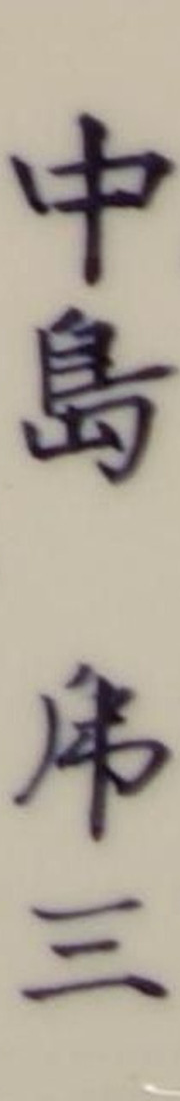中島虎三
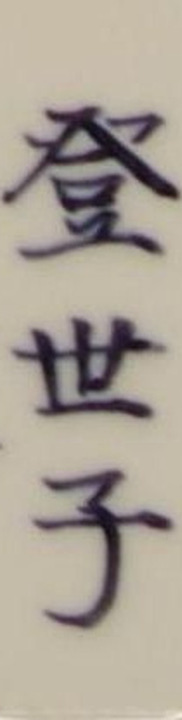登世子
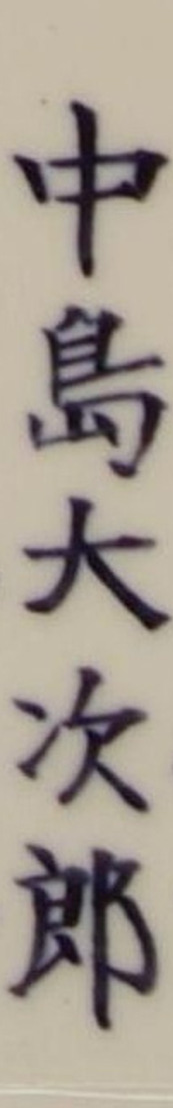中島大次郎
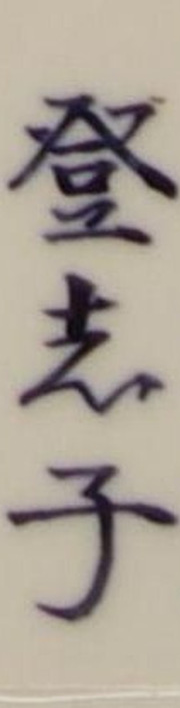登世子
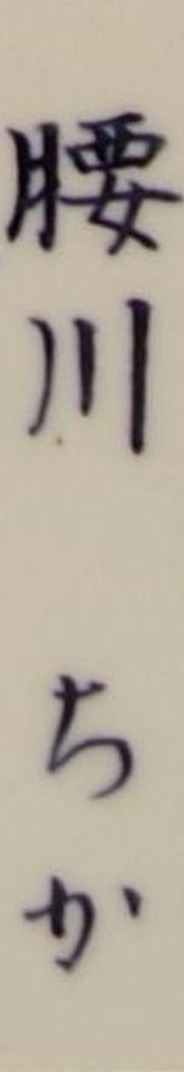腰川ちか
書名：E~L
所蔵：高野山金剛峯寺
